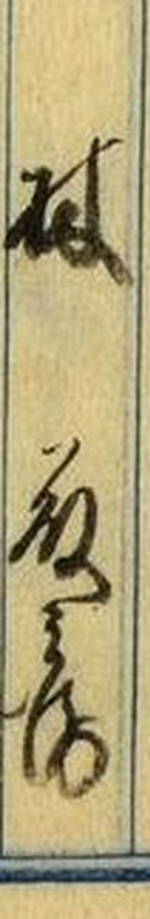林藤兵衛
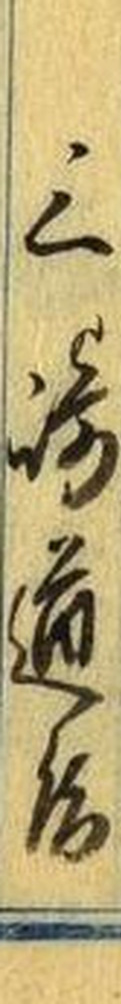三崎道庵
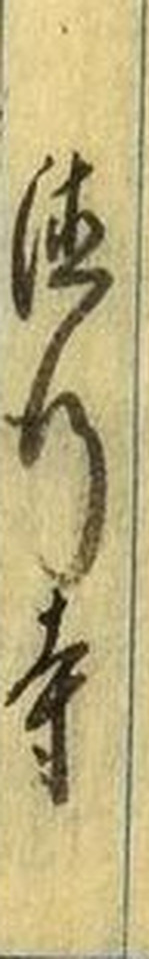徳行寺
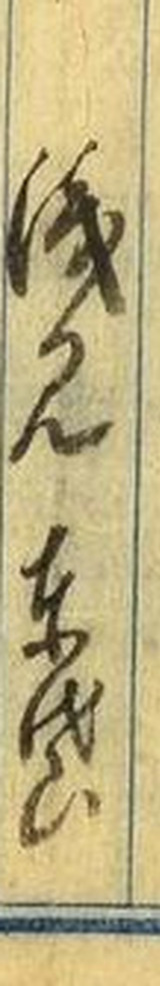浅見東岱
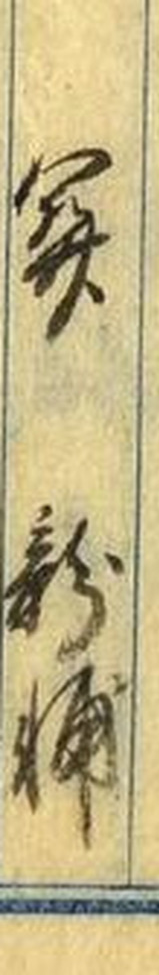関龍輔

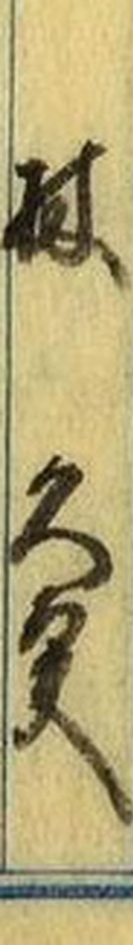林久太夫
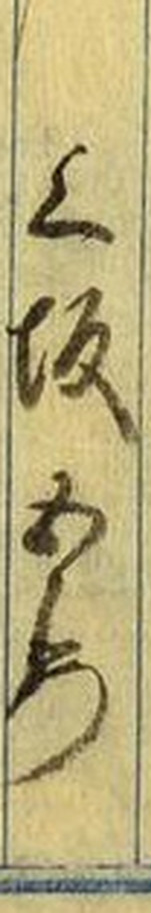上坂五右衛門
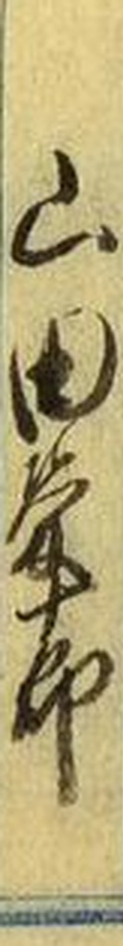山田栄十郎
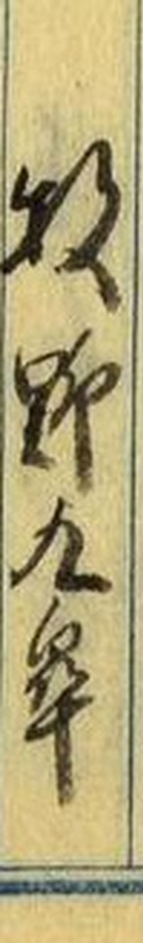牧野九皐
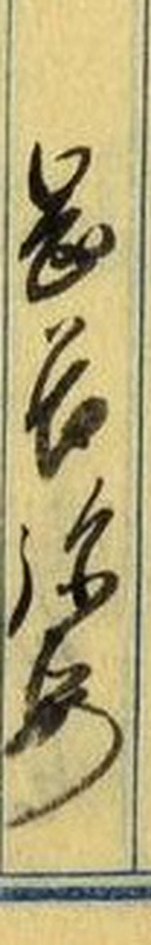岡谷弥右衛門
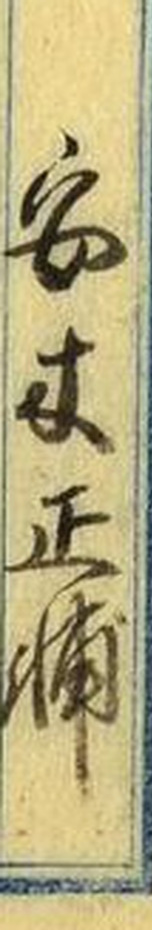安木正輔
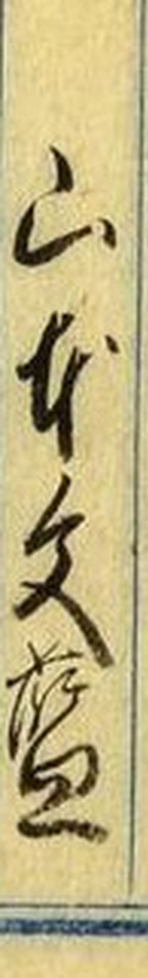山本文藍
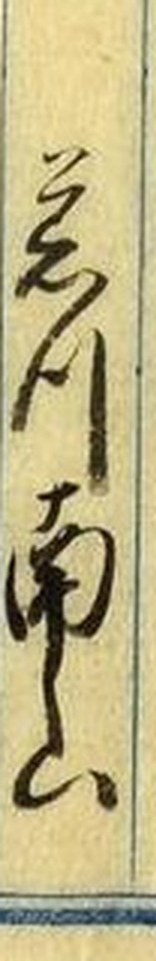荒川南山
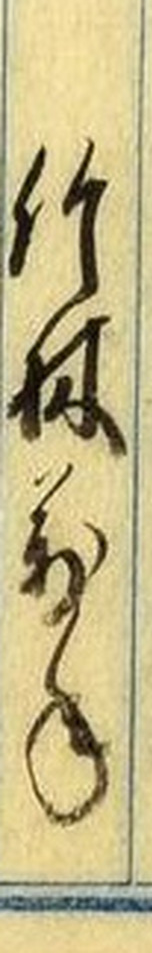竹林万年
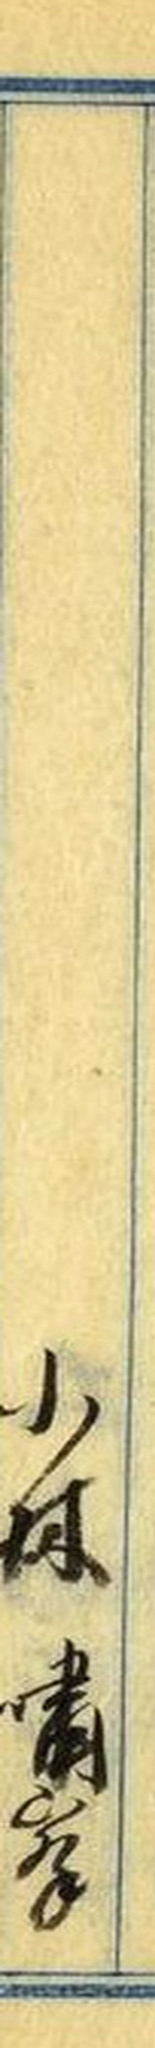小林嘯峯
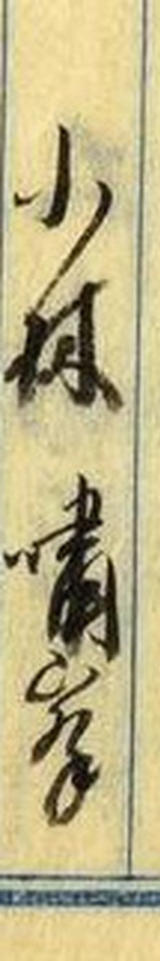小林嘯峯
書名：温古集 四巻
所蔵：福井県文書館 Fukui Prefectural Archives
